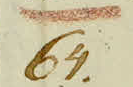64.
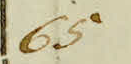65
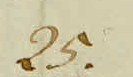25.
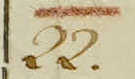22.
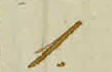1.
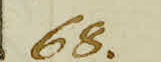68.
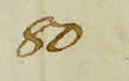80
